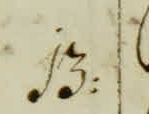13:
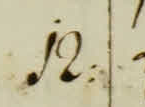12:
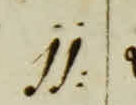11:
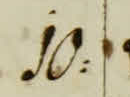10:
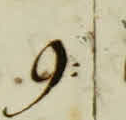9:
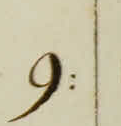9:
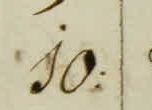10:
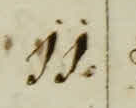11:
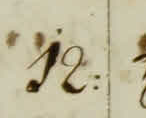12:
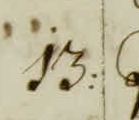13:
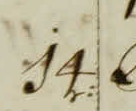14:
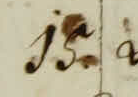15:
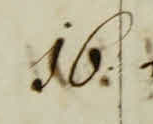16:
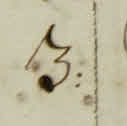3:
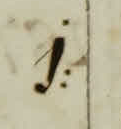1:
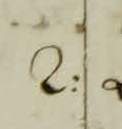2:
